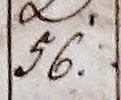56.
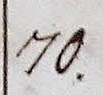70.
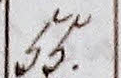55.
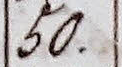50.
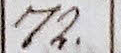72.
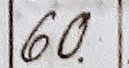60.
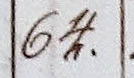64.
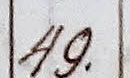49.
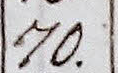70.
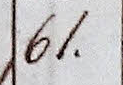61.
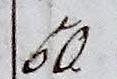50.
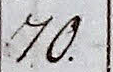70.
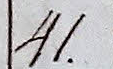41.
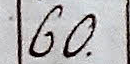60.
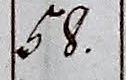58.
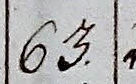63.
